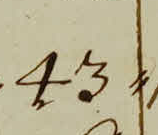43
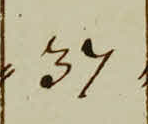37
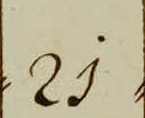21
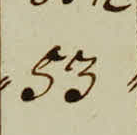53
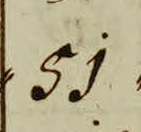51
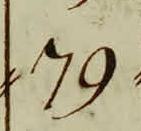79
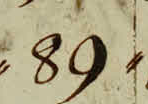89
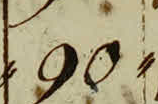90
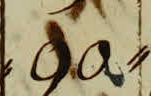90
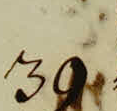39
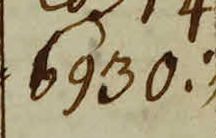6930
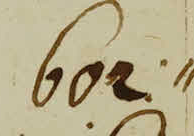602
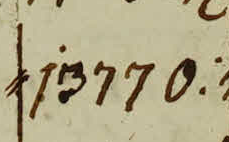13770
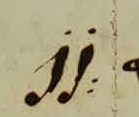11:
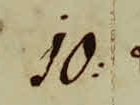10:
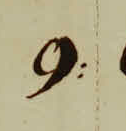9:
